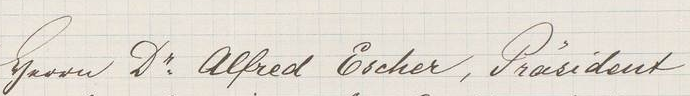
Herrn Dr Alfred Escher, Präsident
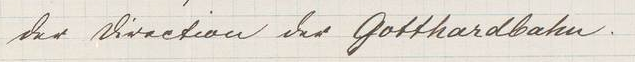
der Direction der Gotthardbahn.
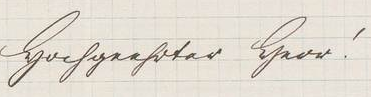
Hochgeehrter Herr!
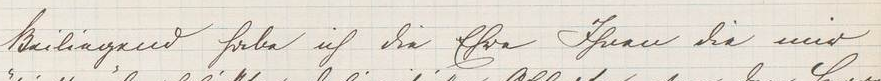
Beiliegend habe ich die Ehre Ihnen die mir
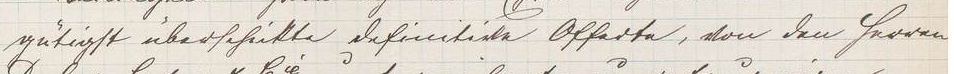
gütigst überschickte definitive Offerte, von den Herren
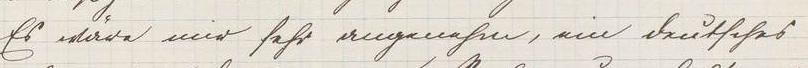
Es wäre mir sehr angenehm, ein deutsches
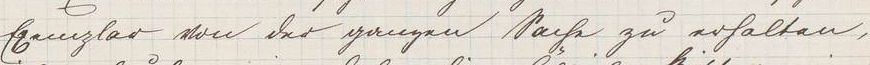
Exemplar von der ganzen Sache zu erhalten,
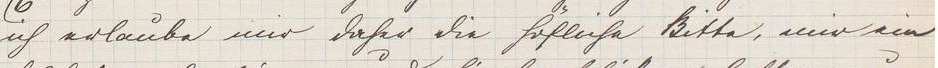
ich erlaube mir daher die höfliche Bitte, mir ein
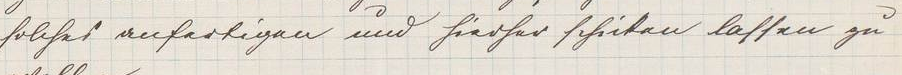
solches anfertigen und hierher schicken lassen zu
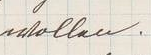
wollen.
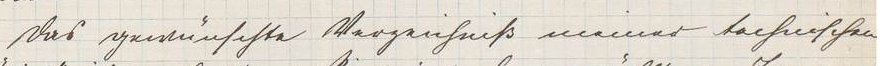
Das gewünschte Verzeichniß meiner technischen
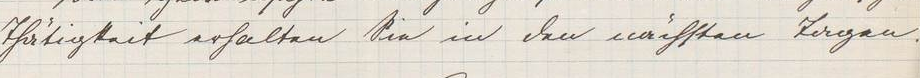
Thätigkeit erhalten Sie in den nächsten Tagen.
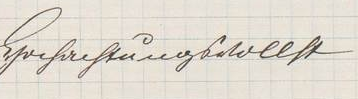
Hochachtungsvollst
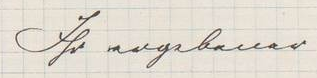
Ihr ergebener
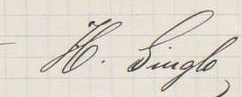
H. Single
